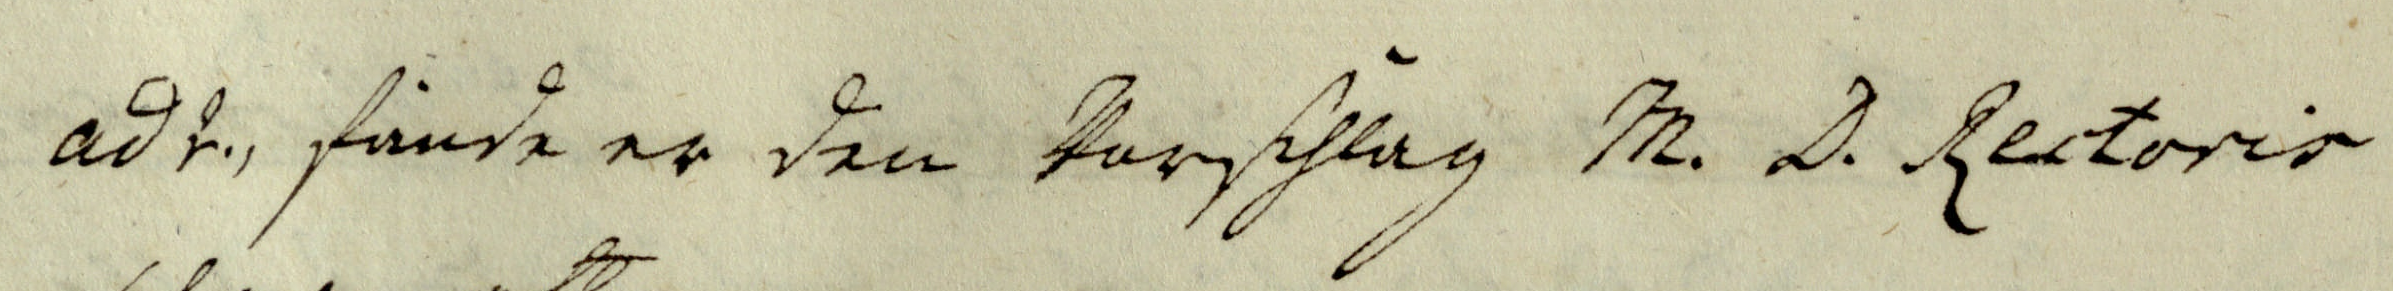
ad 2., fände er den Vorschlag M. D. Rectoris
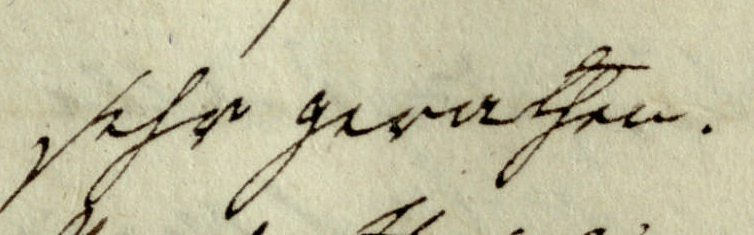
sehr gerathen.
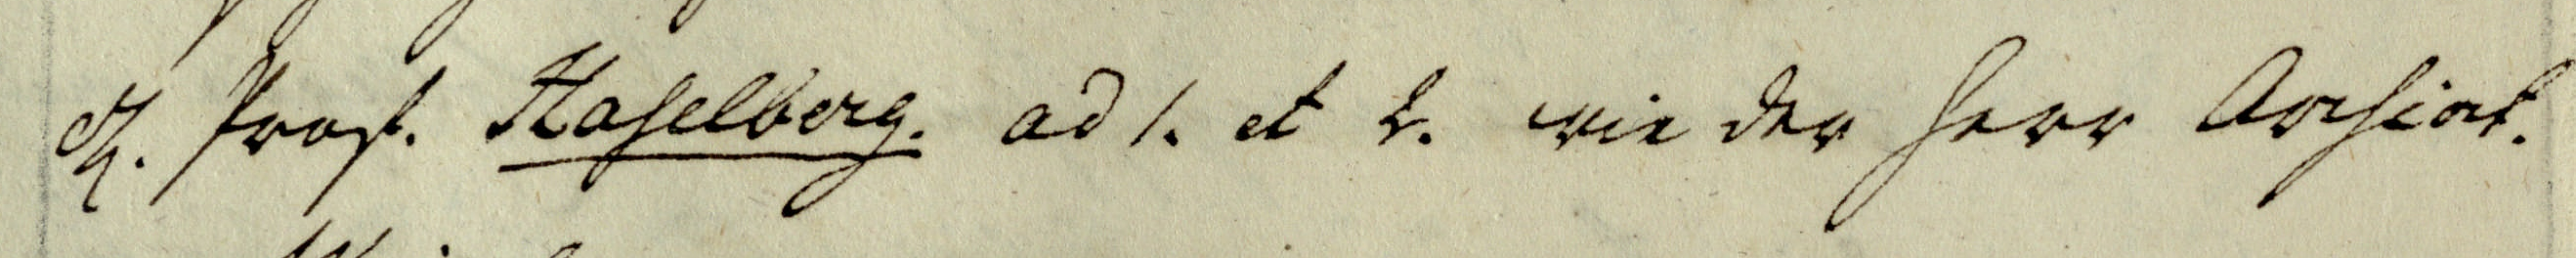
dh. Prof. Haselberg. ad 1. et 2. wie der Herr Arhiat.
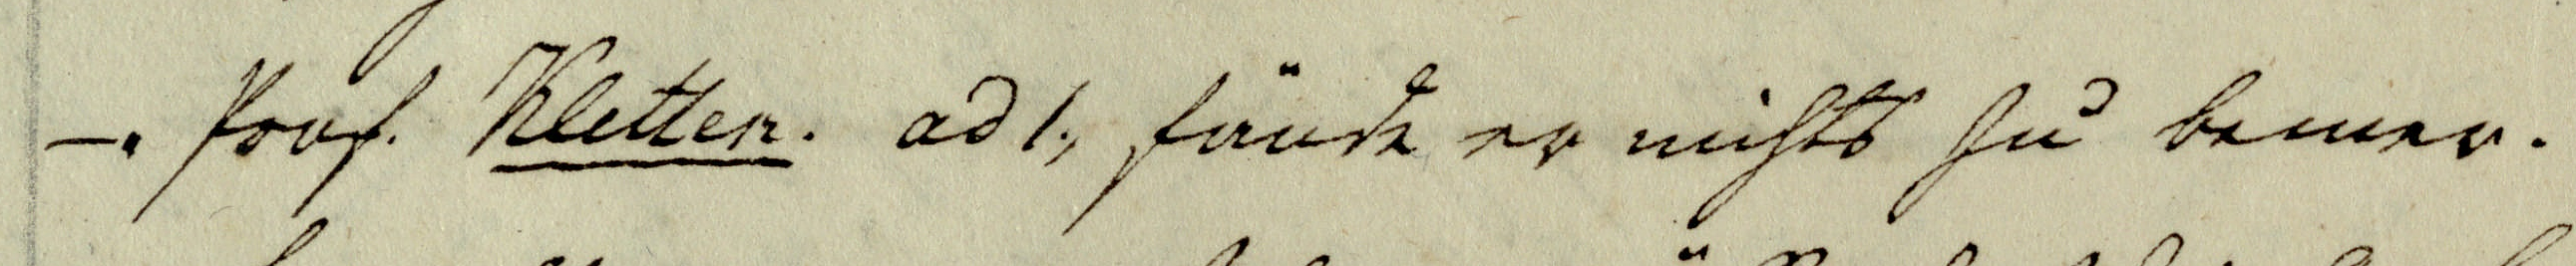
Prof. Kletten. ad 1. fände er nichts zu bemer¬
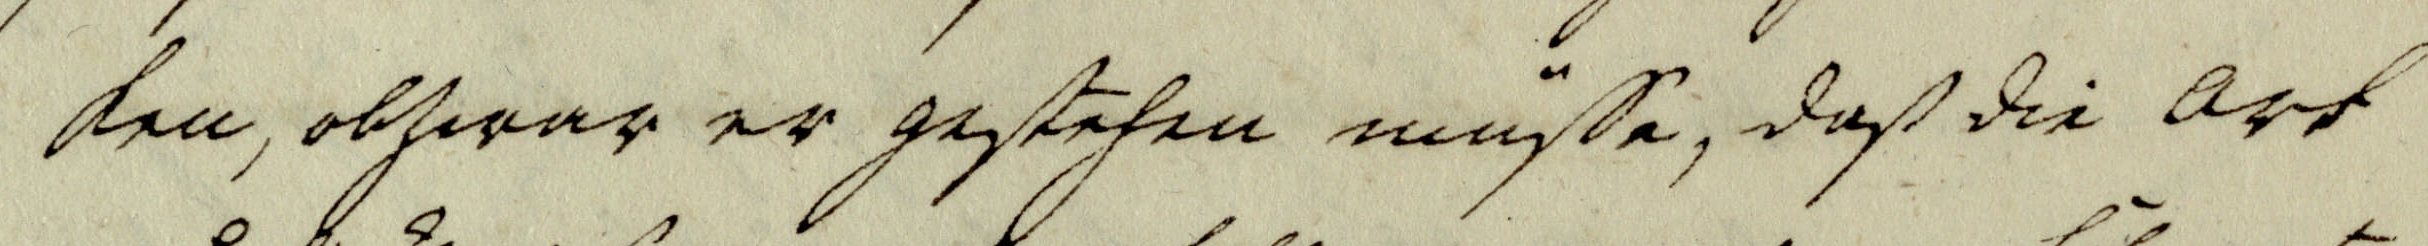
ken, obzwar er gestehen müsse, daß die Art
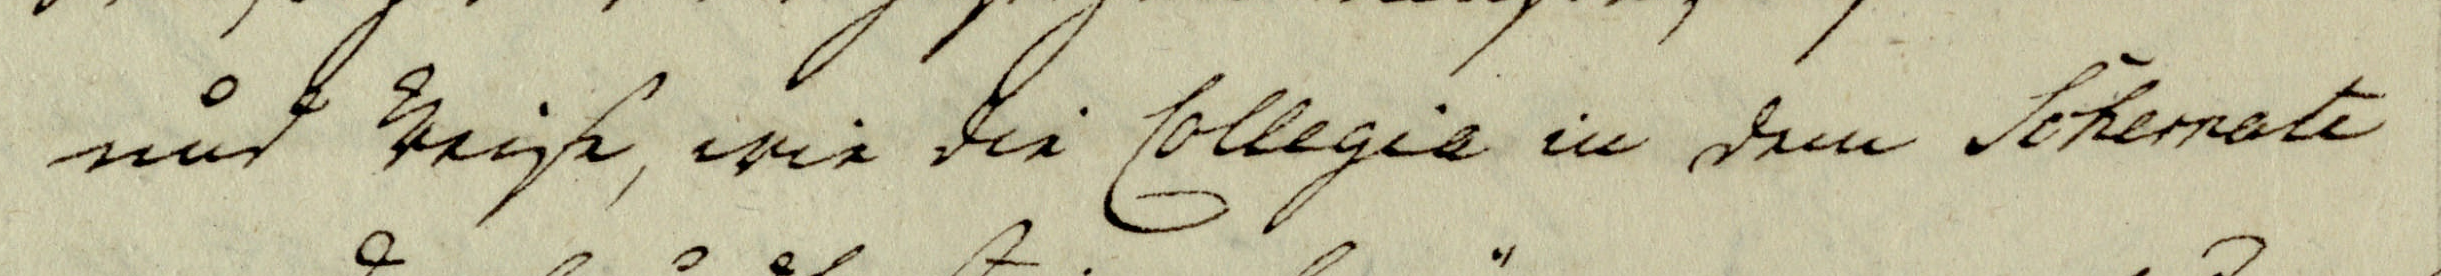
und Weise, wie die Collegia in dem Schemate
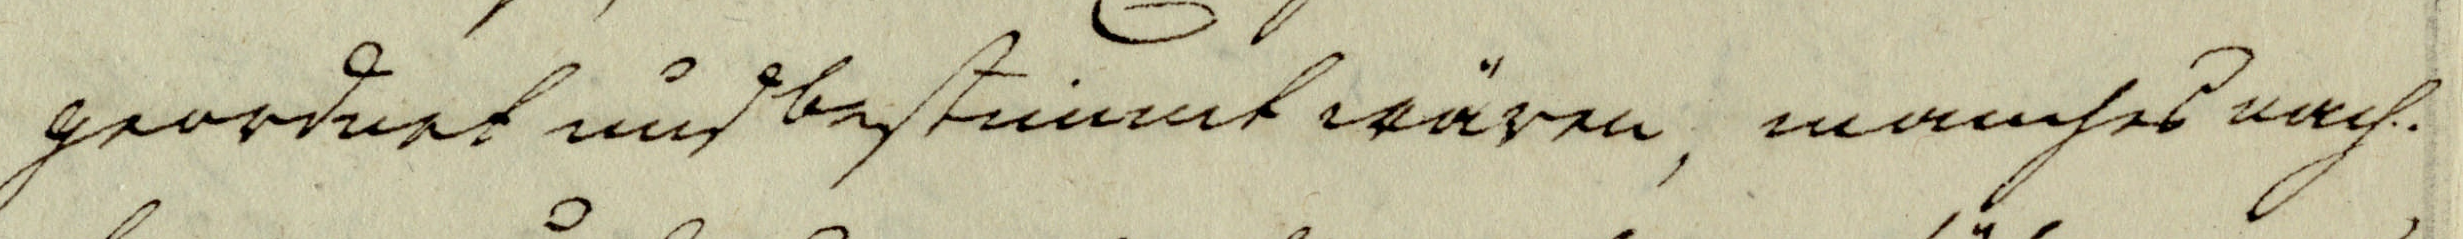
geordnet und bestimmt wären, manches nach¬
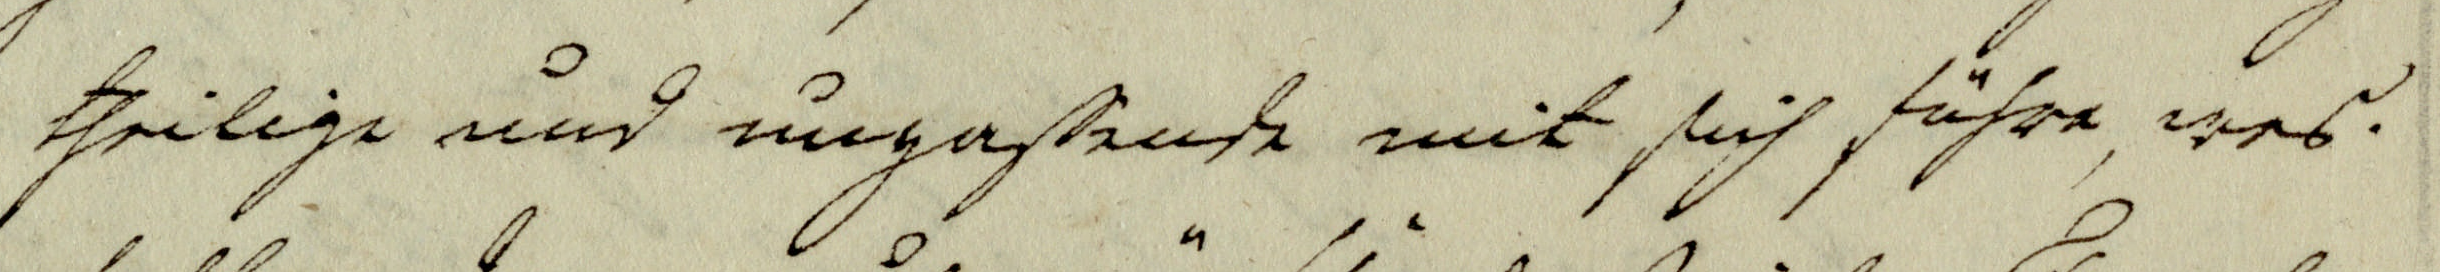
theilige und unpassende mit sich führe, wes¬
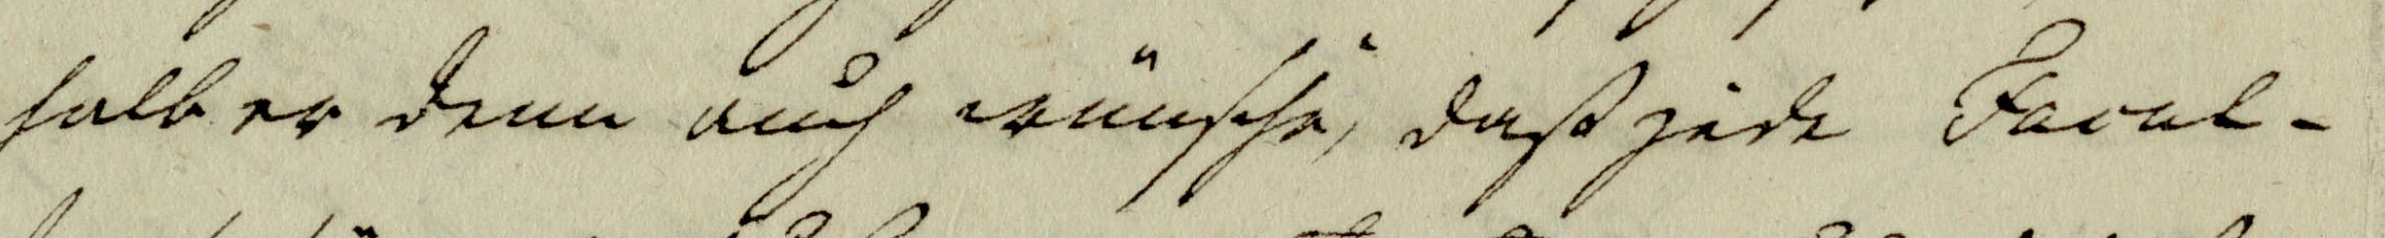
halb er denn auch wünsche, daß jede Facul¬
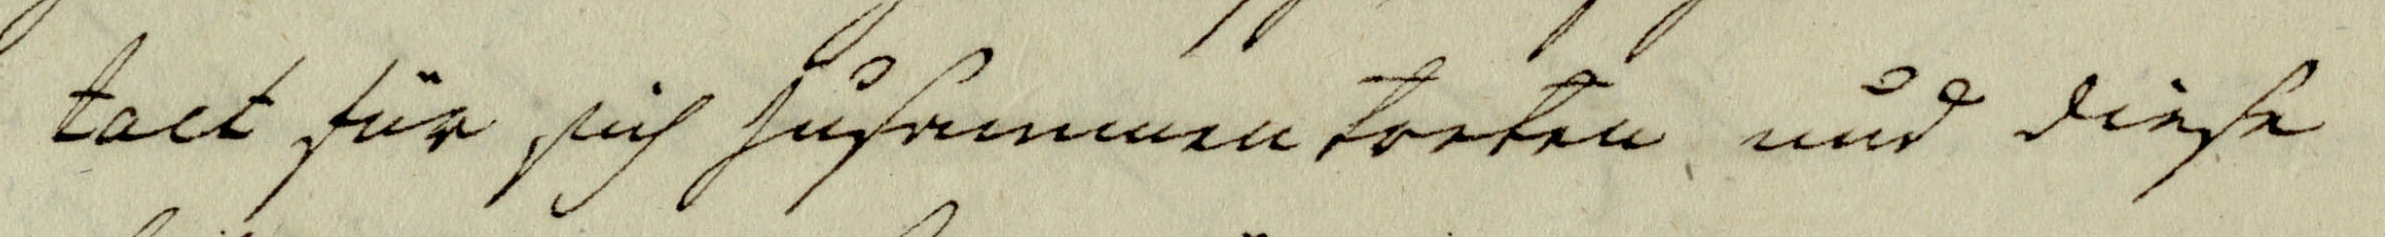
taet für sich zusammentreten und diese
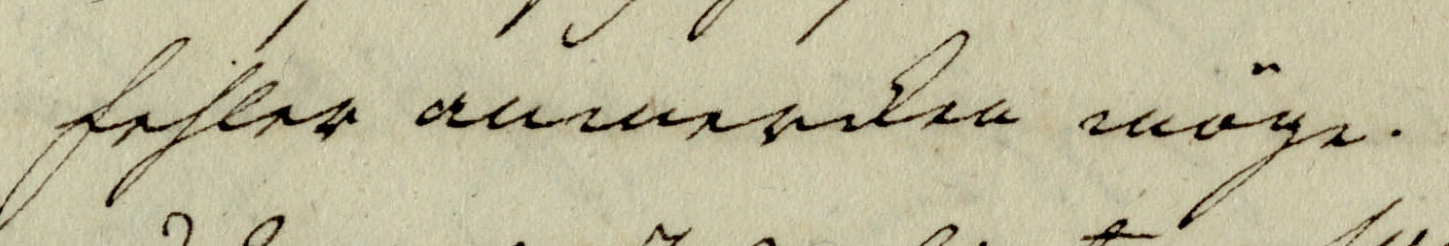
Fehler anmercken möge.
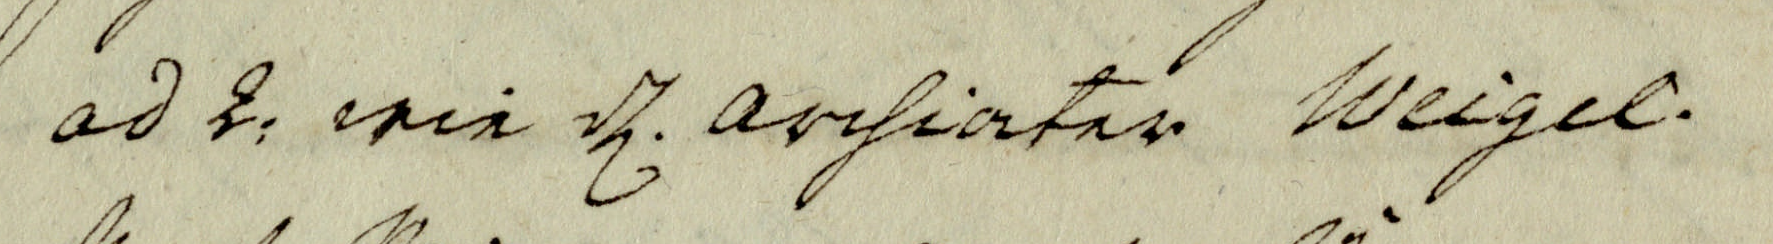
ad 2. wie dh. Archiater Weigel.
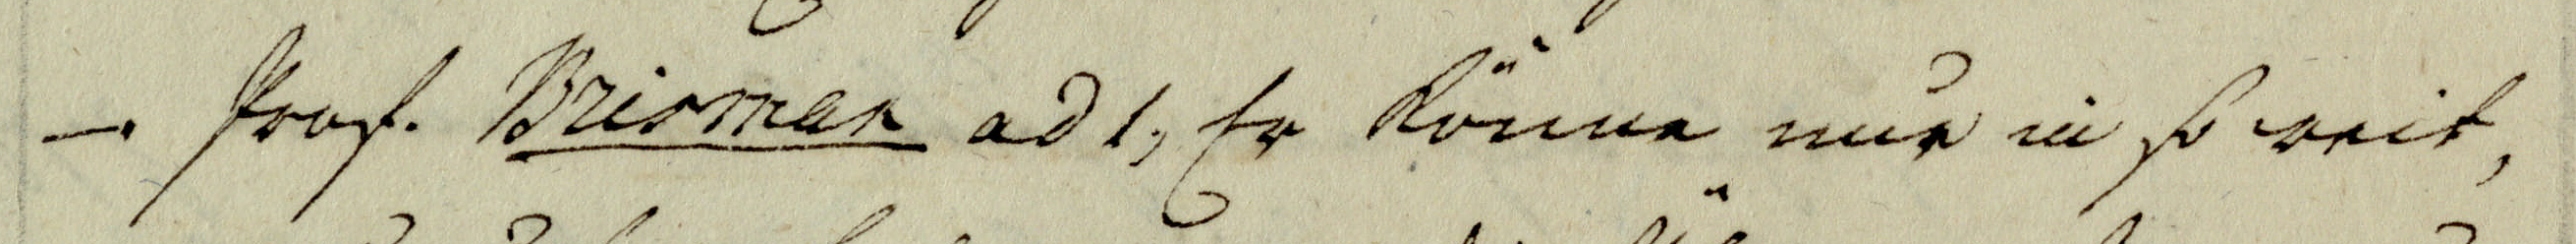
Prof. Brisman. ad 1., Er könne nur in so weit,
